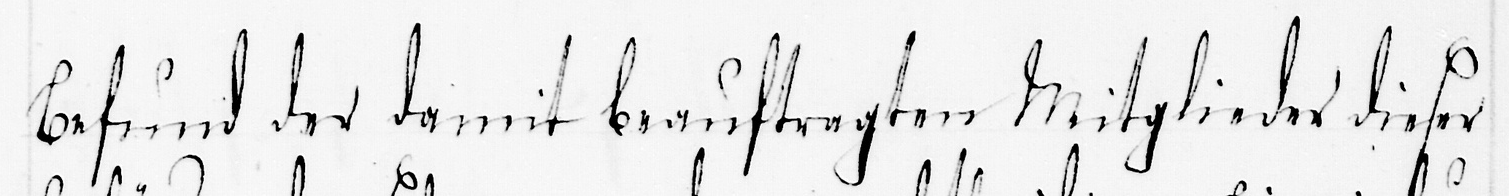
Befund der damit beauftragten Mitglieder dieser
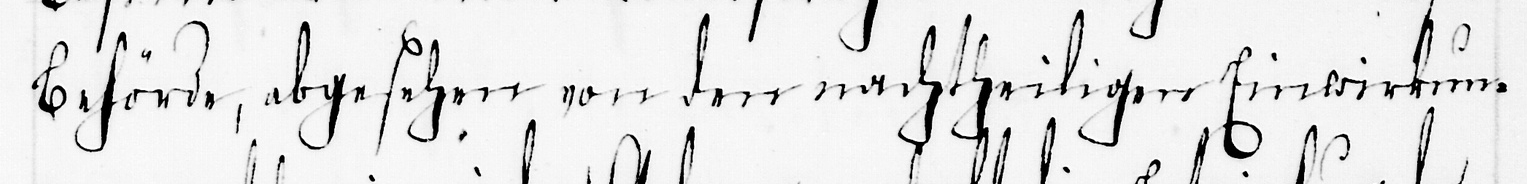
Behörde, abgesehen von den nachtheiligen Einwirkun¬
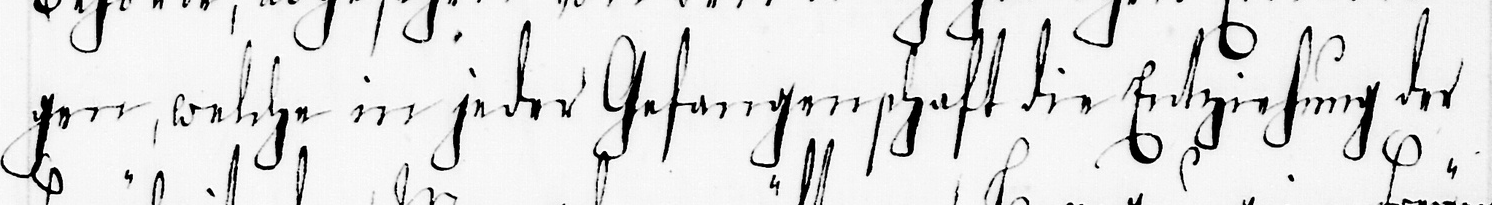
gen, welche in jeder Gefangenschaft die Entziehung der
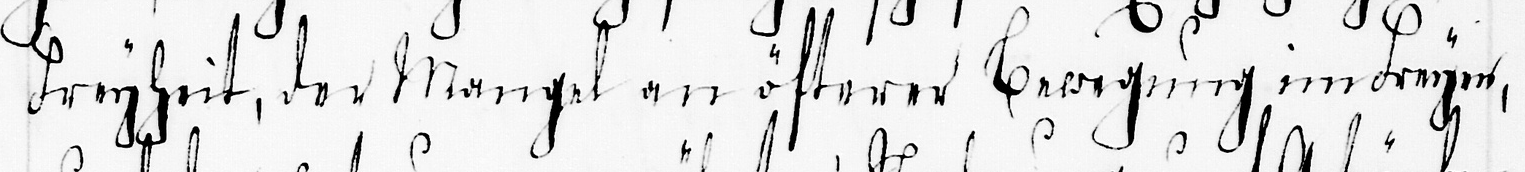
Freyheit, der Mangel an öfterer Bewegung im Freyen,
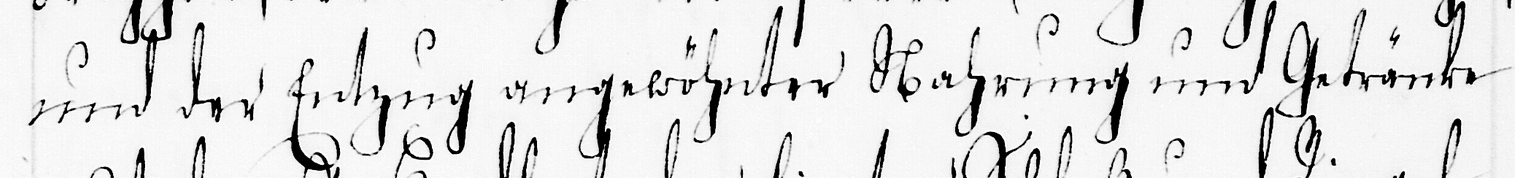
und der Entzug angewöhnter Nahrung und Getränke
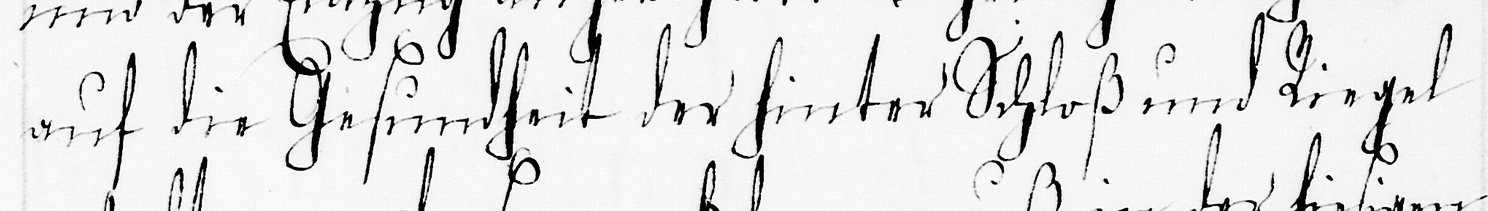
auf die Gesundheit der hinter Schloß und Riegel
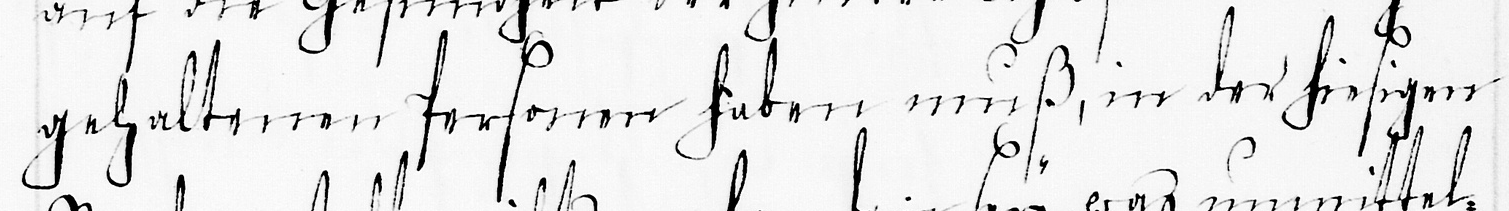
gehaltenen Personen haben muß, in der hiesigen
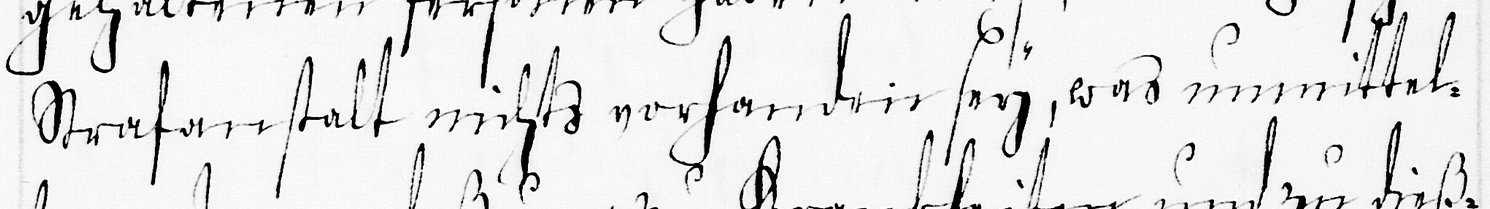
Strafanstalt nichts vorhanden sey, was unmittel¬
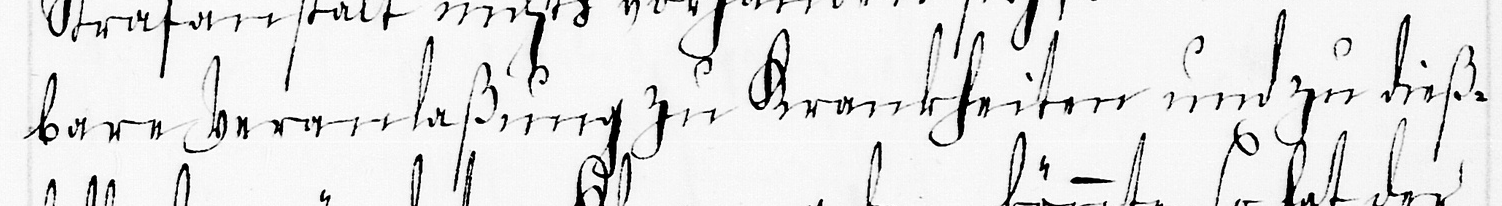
bare Veranlaßung zu Krankheiten und zu dieß¬
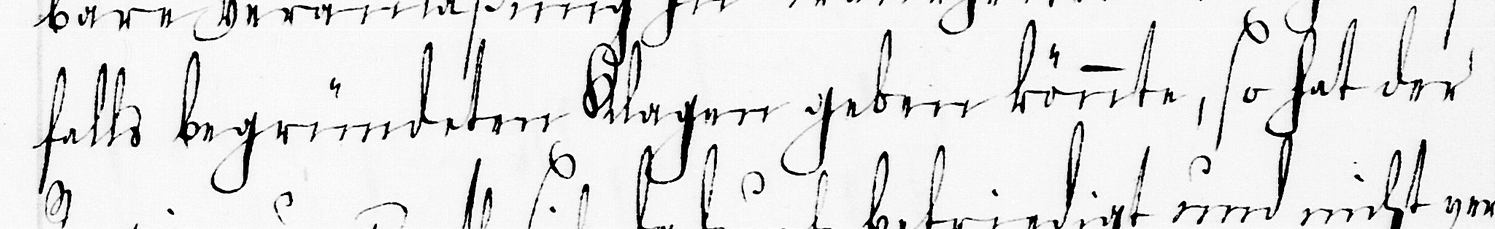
falls begründeten Klagen geben könnte, so hat der
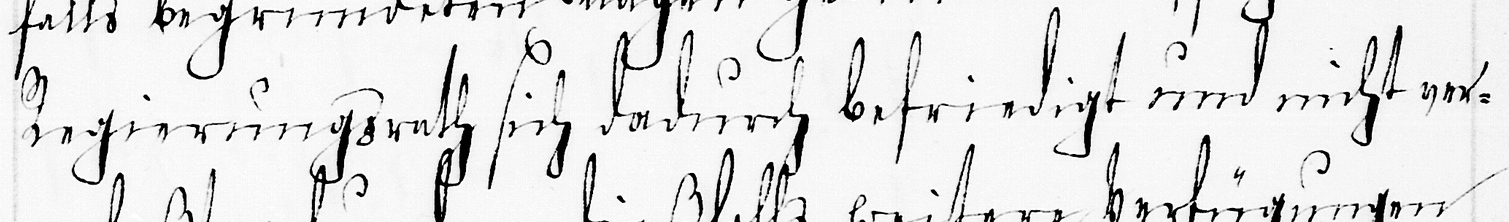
Regierungsrath sich dadurch befriedigt und nicht ver¬
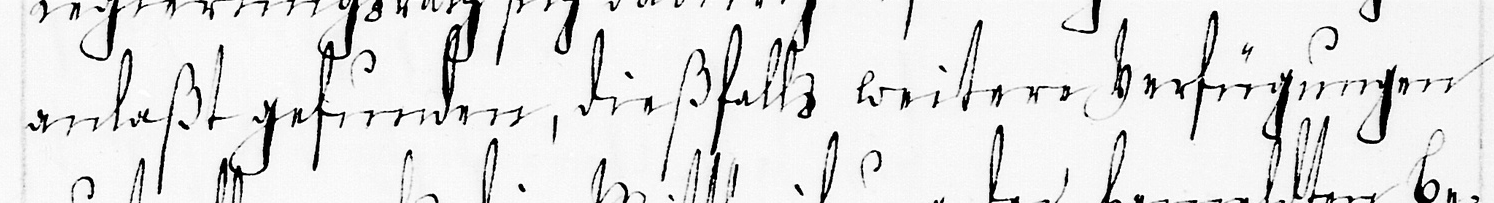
anlaßt gefunden, dießfalls weitere Verfügungen
